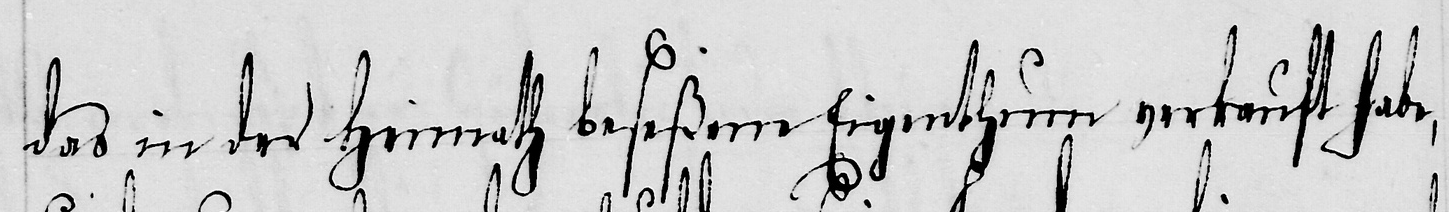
das in der Heimath beseßene Eigenthum verkauft hab¬
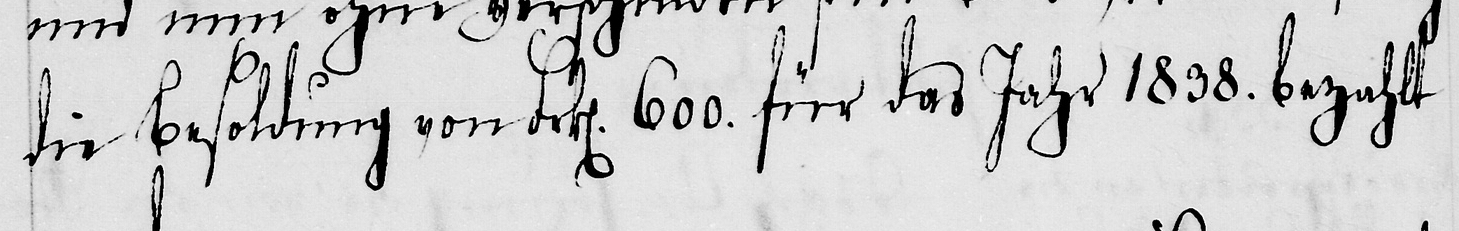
die Besoldung von Frk[en]. 600. für das Jahr 1838. bezahlt
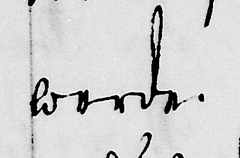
werde.
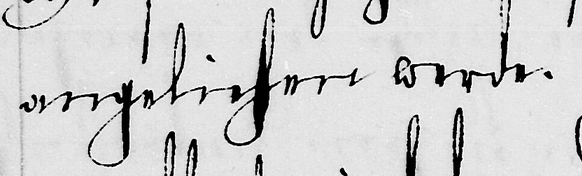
angeliehen werde.
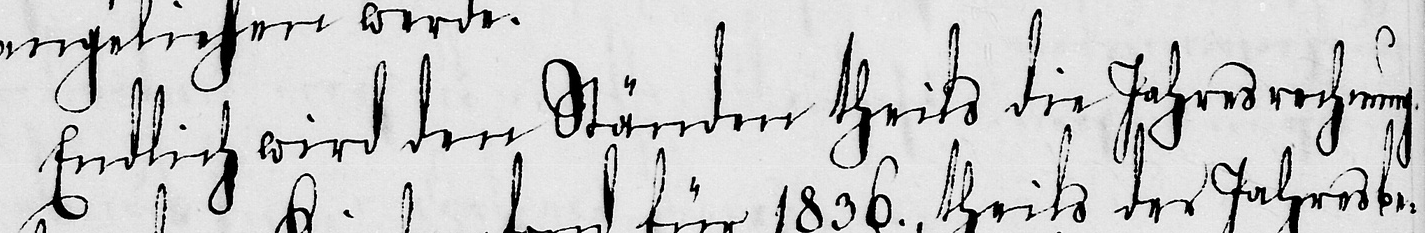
Endlich wird den Ständen theils die Jahresrechnu¬
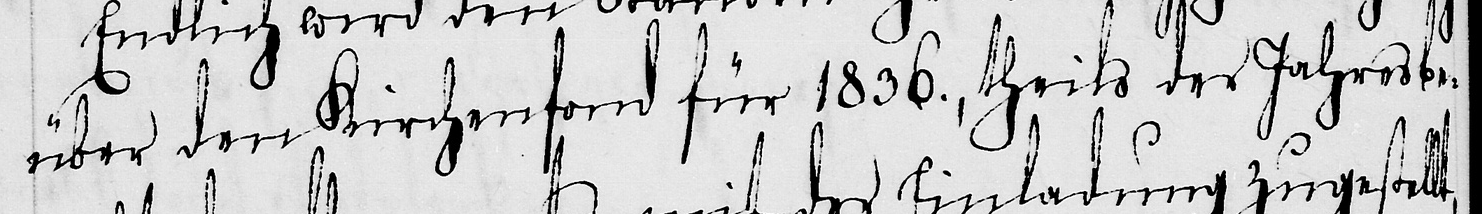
über den Kirchenfond für 1836., theils der Jahresbe¬
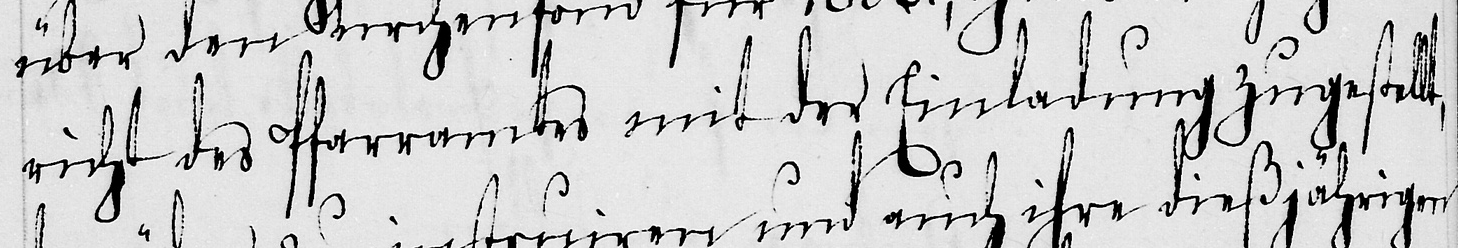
richt des Pfarramtes mit der Einladung zugestel¬
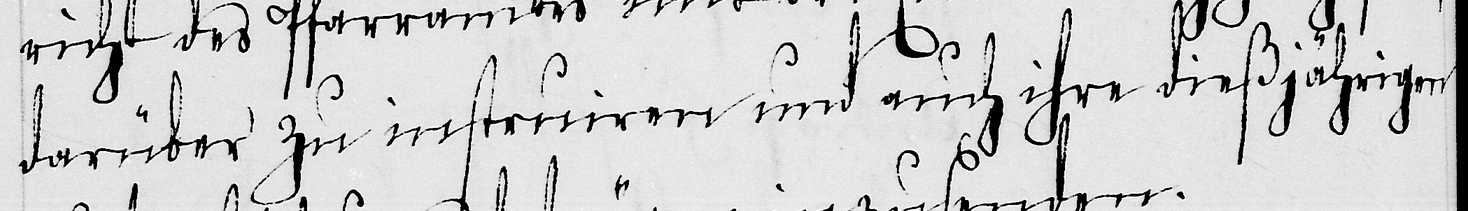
darüber zu instruiren und auch ihre dießjährigen
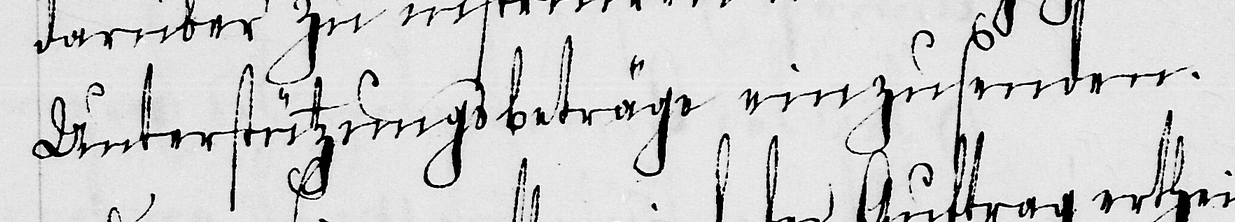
Unterstützungsbeträge einzusenden.
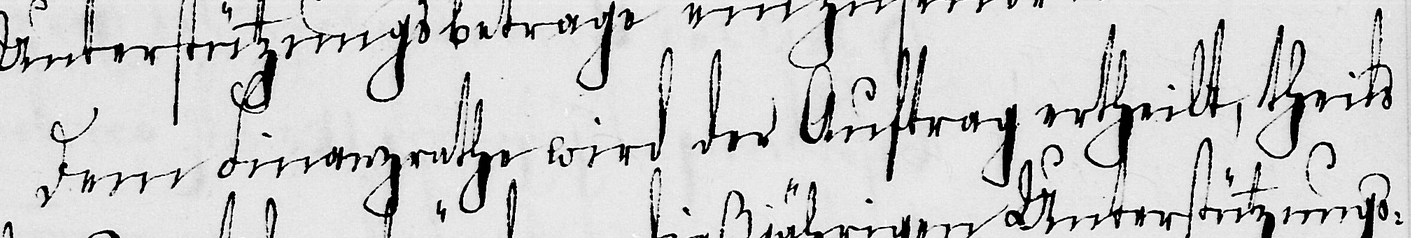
Dem Finanzrathe wird der Auftrag ertheilt, theils
